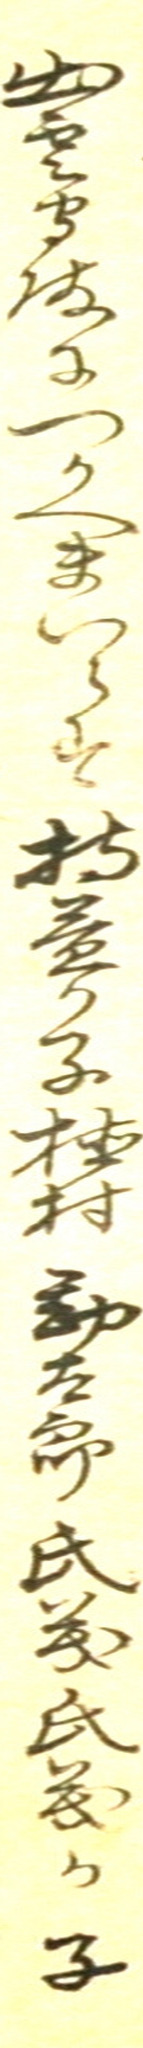出雲守殿につけへまいらす持益か子植村勘太郎氏義氏義か子
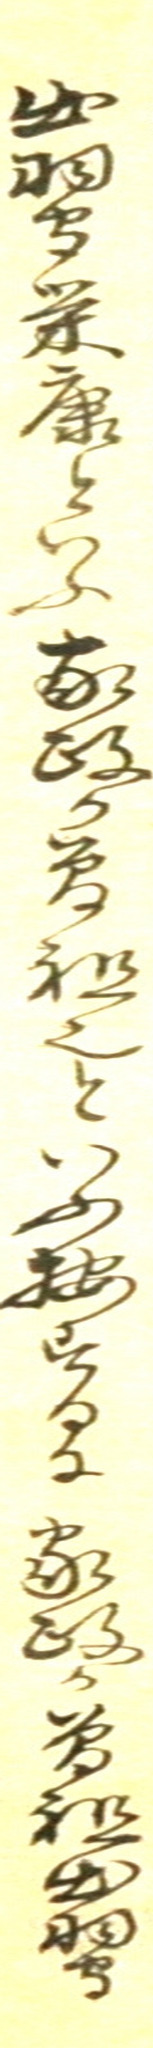出羽守栄康といふ家政か曽祖也といふ按するに家政か曽祖出羽守
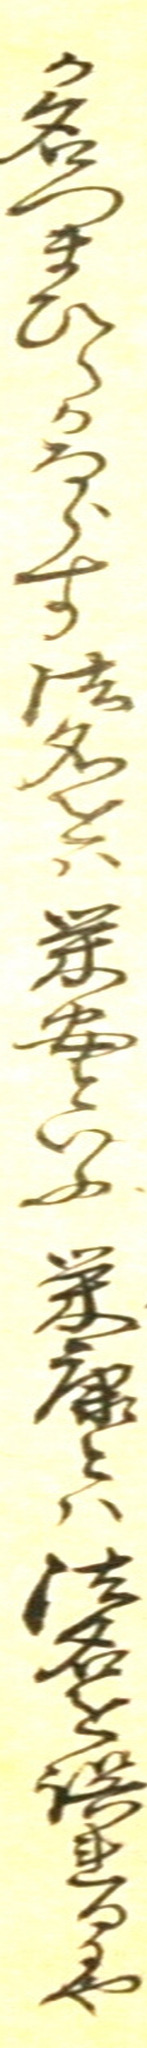か名つまひらかならす法名をは栄安といふ栄康とは法名を誤れるにや
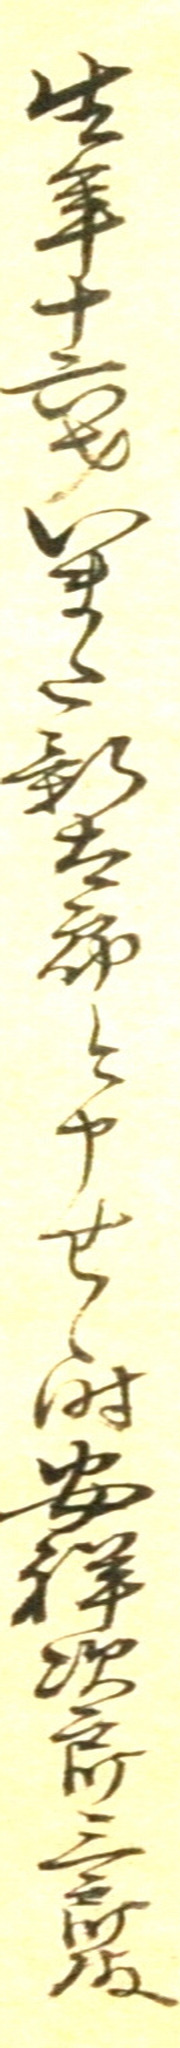生年十六才いまた新太郎と申せし時安祥二郎三郎殿
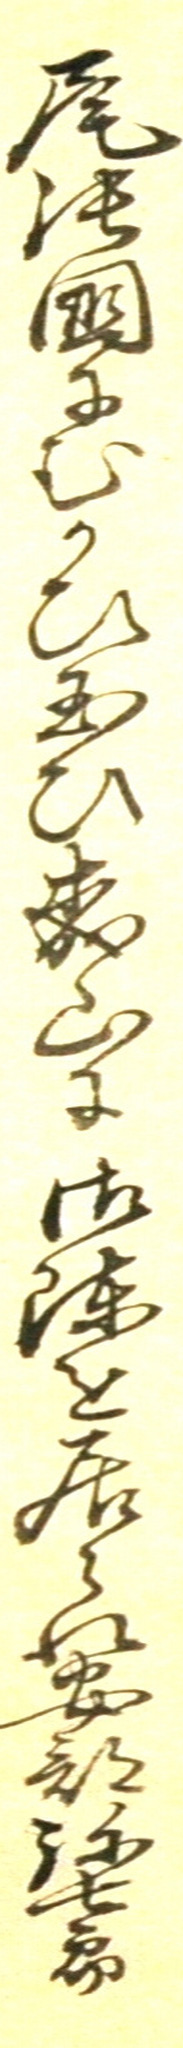尾張国にむかひ玉ひ森山に御陣を居られ安部弥七郎
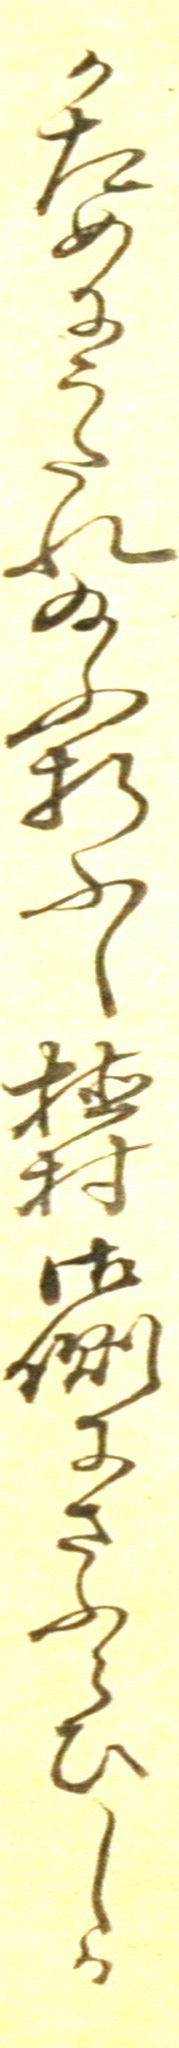かためにうたれ給ふ折ふし植村御側にさふらひしか
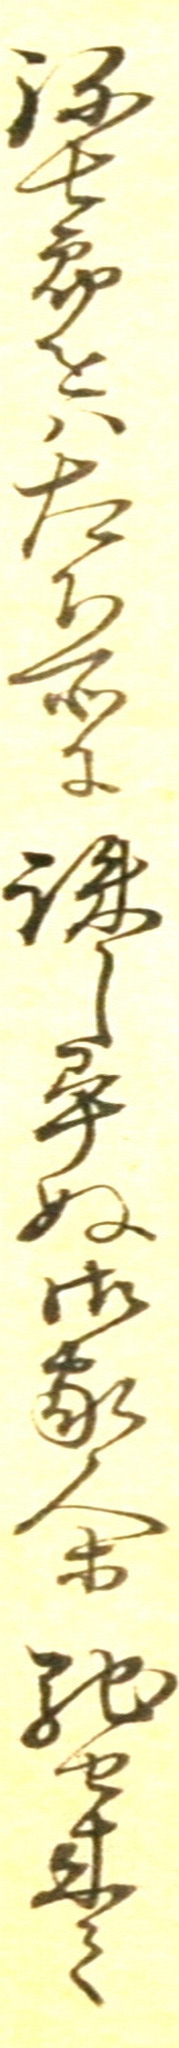弥七郎をはたち所に誅し畢ぬ御家人等馳せ来て
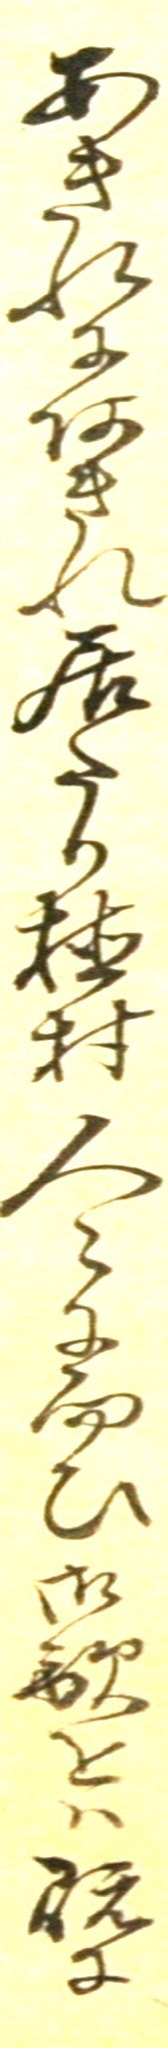あきれにあきれ居たり植村人々に向ひ御敵をは既に

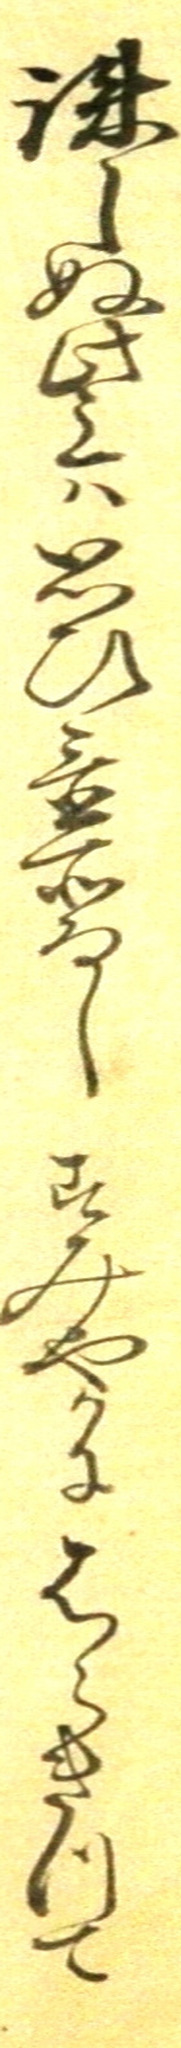誅しぬ此上は思ひ置所なしすみやかにはらきつて
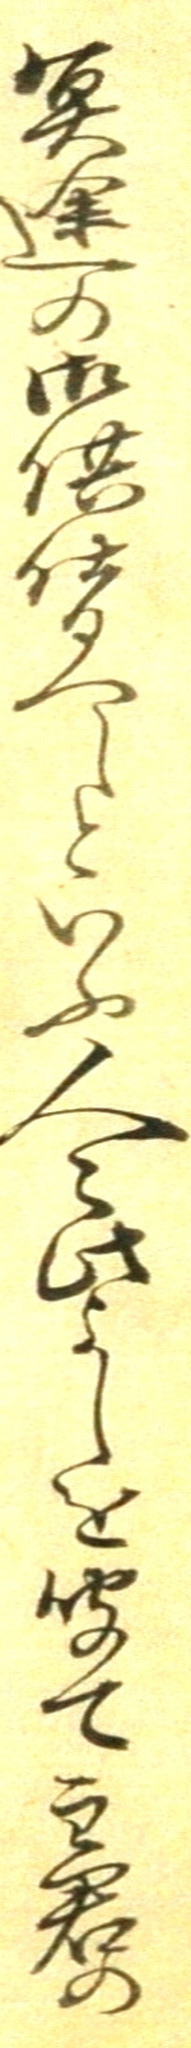冥途の御供仕るへしといふ人々此よしを聞て主君の
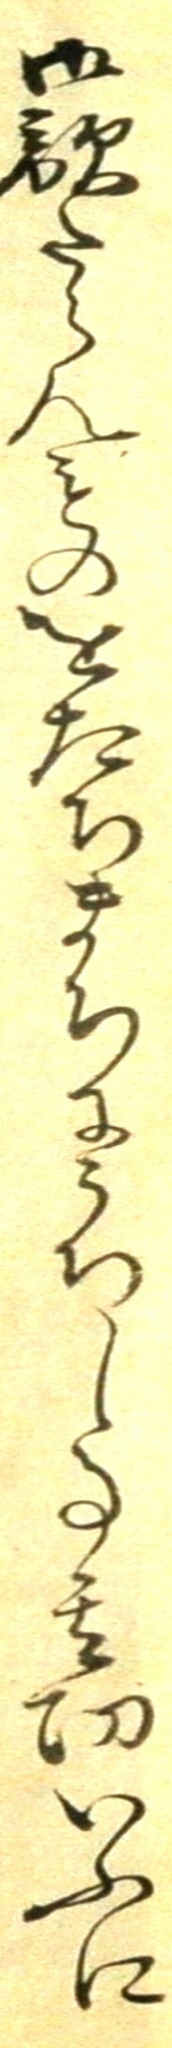御敵たらんものをたちまちにうちし事其功いふに
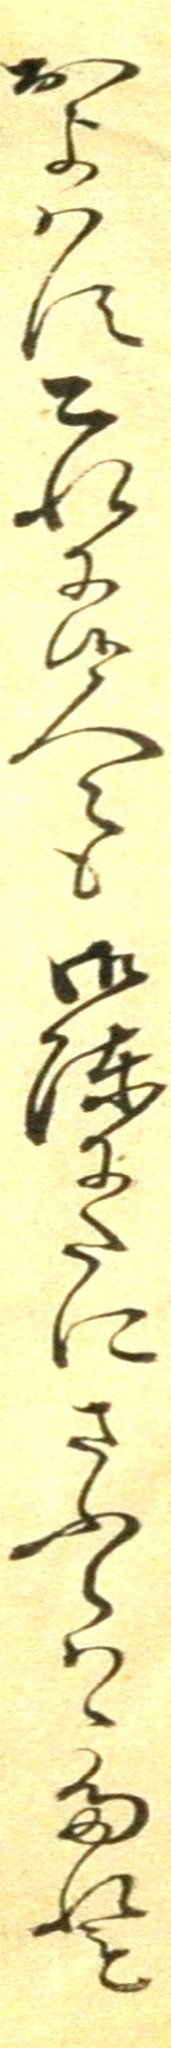およはすこれに候人々も御陣にたにさふらはゝたれも
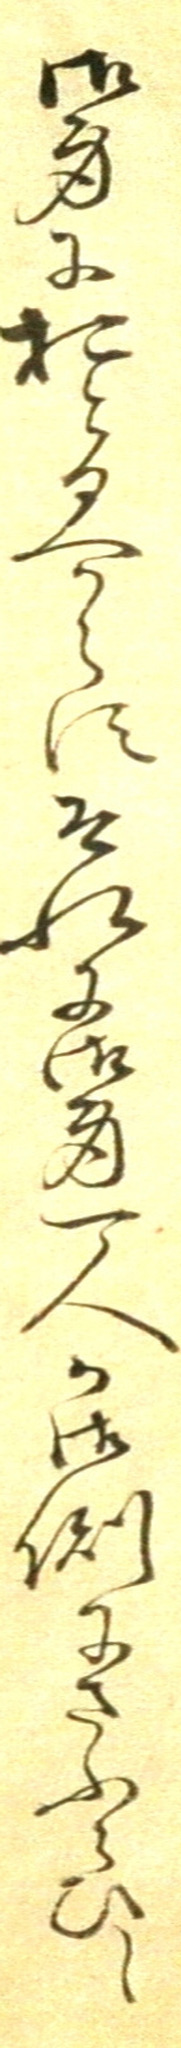御身におとるへからすそれに御身一人か御側にさふらひし
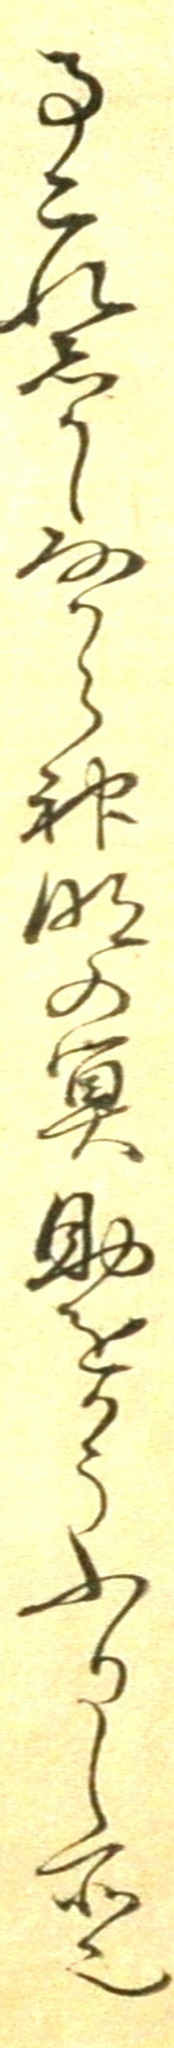事これしかしなから神明の冥助をかうふりし所也
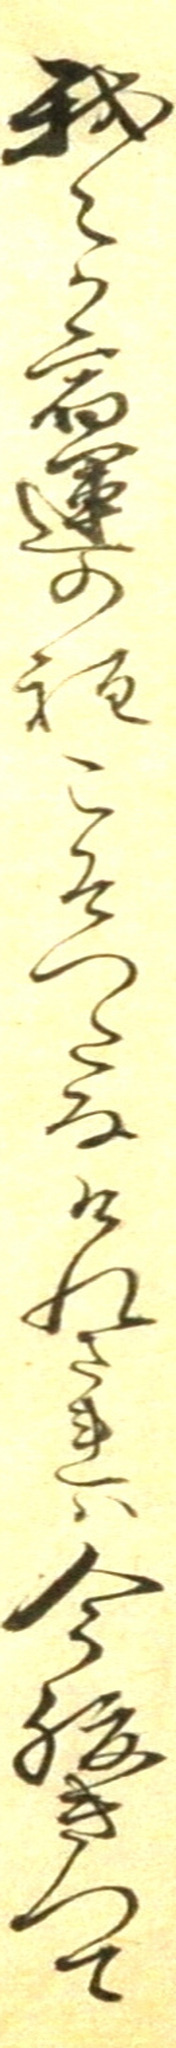我々か宿運の程こそつたなけれされは今腹きつて
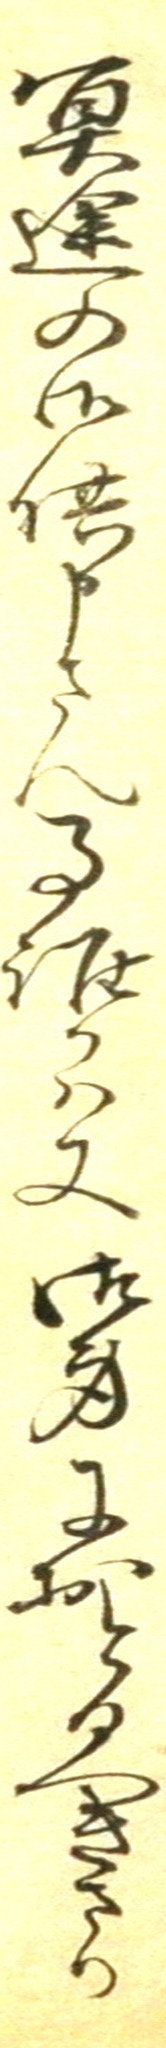冥途の御供申さん事誰かは又御身におとるへきさり
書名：藩翰譜（四・中）
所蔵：伊那市立高遠町図書館・合同会社AMANE
